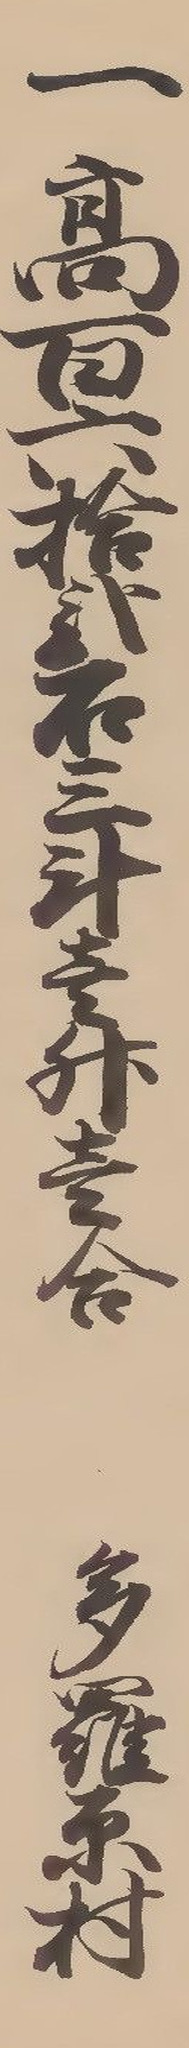一高百六拾弐石三斗壱升壱合多羅原村
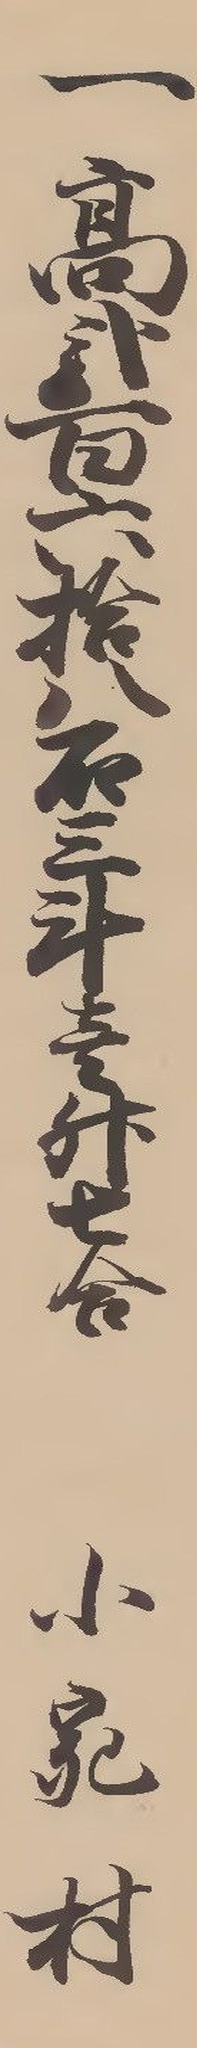一高弐百六拾八石三斗壱升七合小宛村
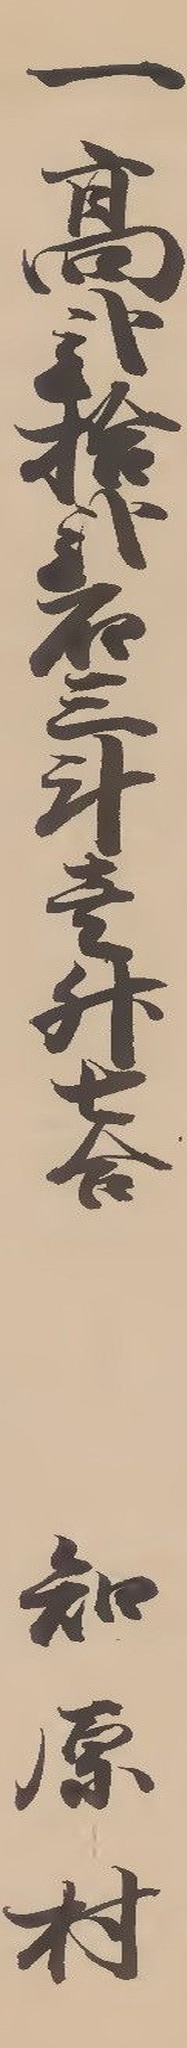一高弐拾弐石三斗壱升七合知原村
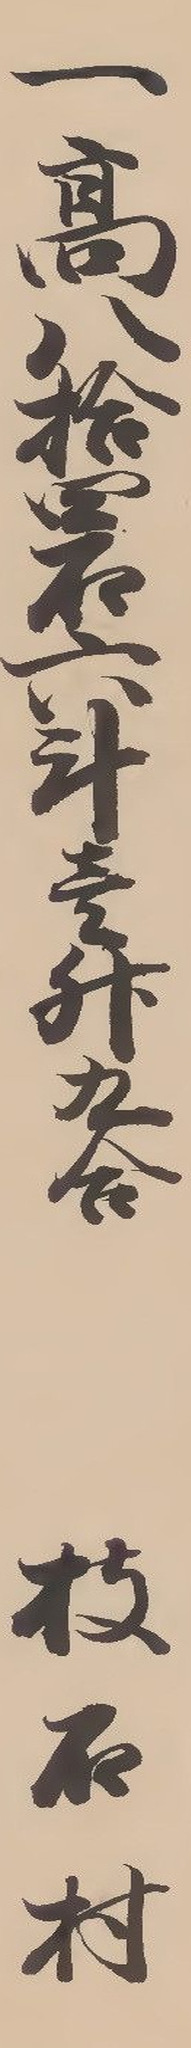一高八拾四石六斗壱升九合枝石村
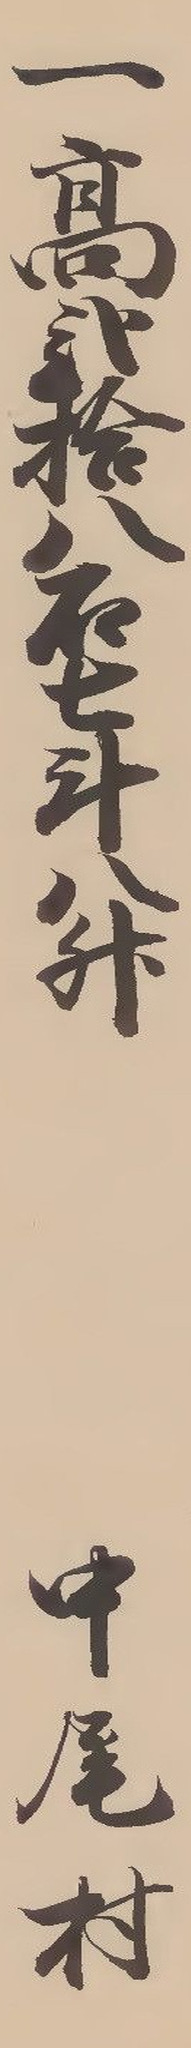一高弐拾八石七斗八升中尾村
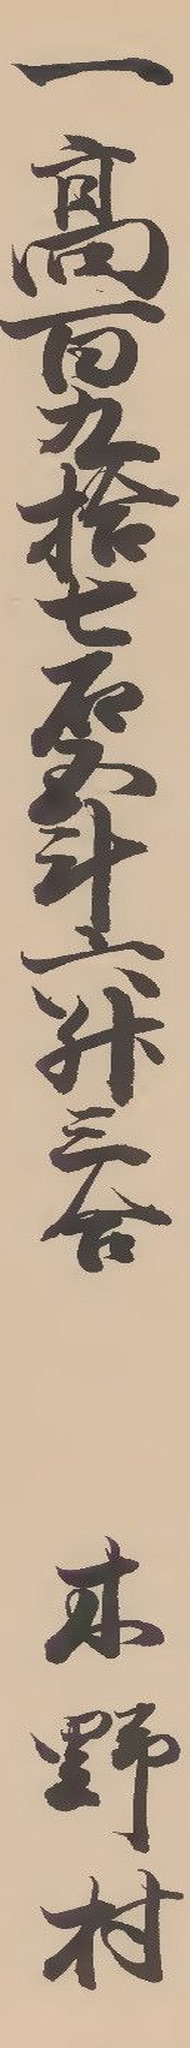一高百九拾七石五斗六升三合木野村

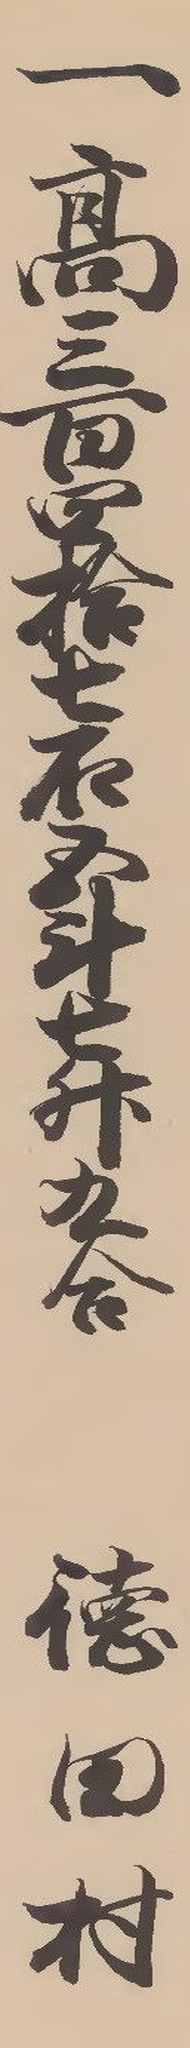一高三百四拾七石五斗七升九合徳田村
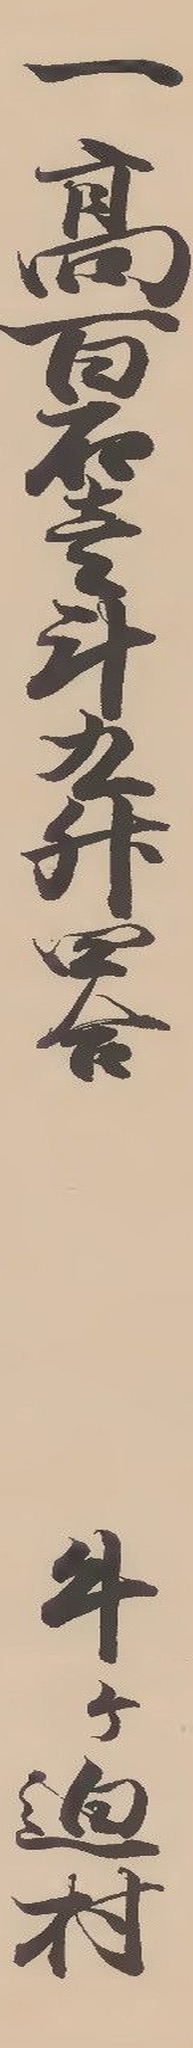一高百石壱斗九升四合牛ヶ迫村
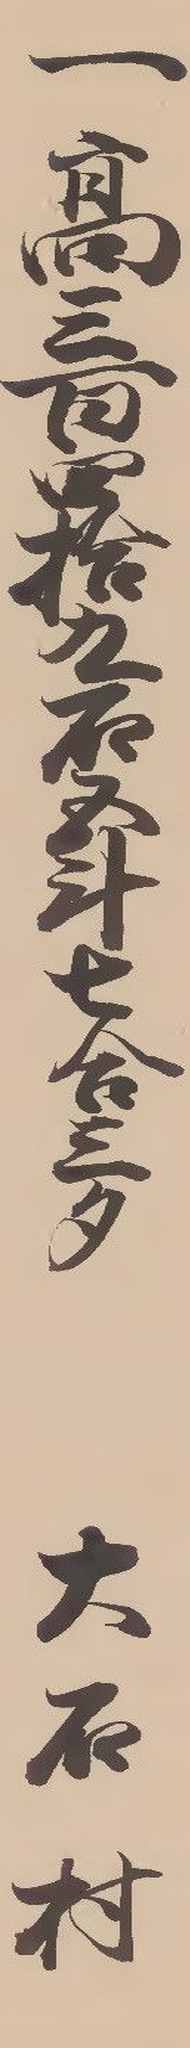一高三百四拾九石五斗七合三勺大石村
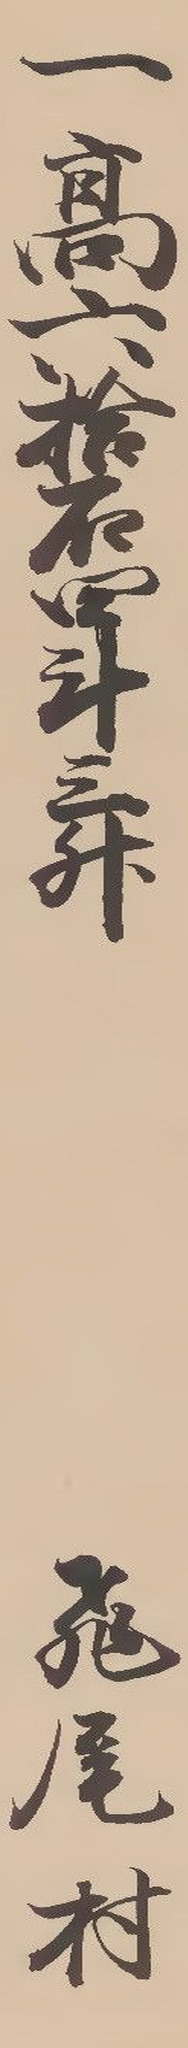一高六拾石四斗三升飛尾村
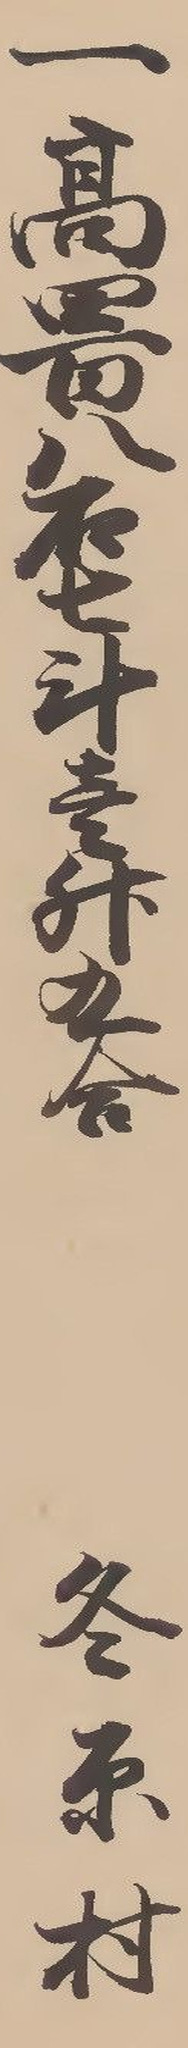一高四百八石七斗壱升九合冬原村
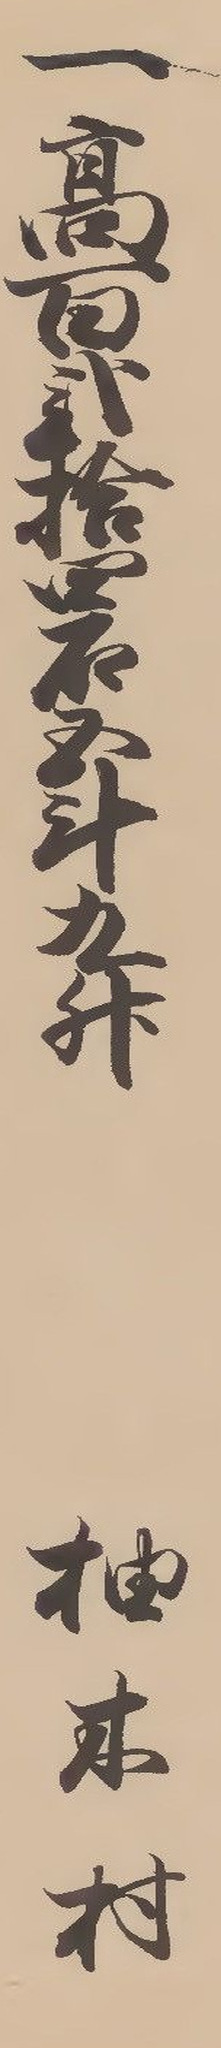一高百弐拾四石五斗九升柚木村
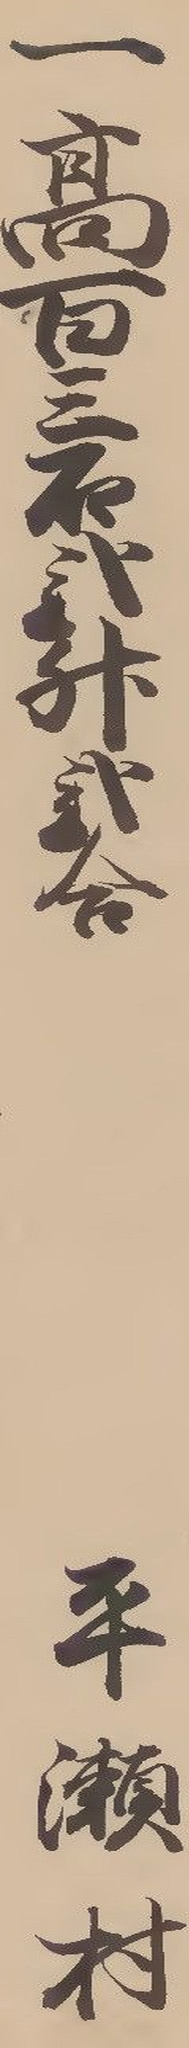一高百三石弐升弐合平瀬村

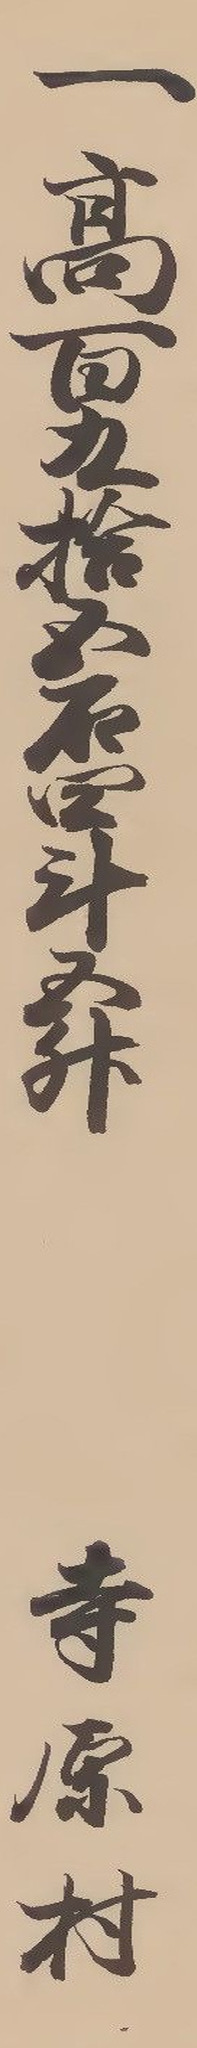一高百九拾五石四斗五升寺原村
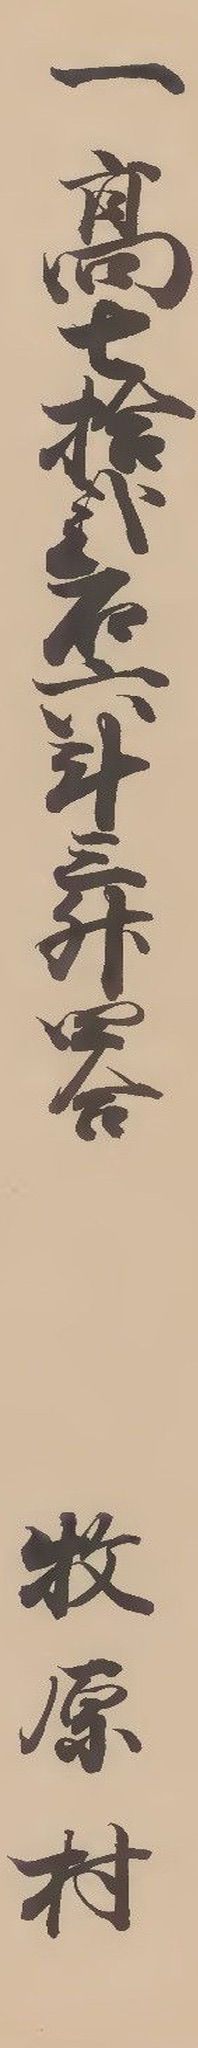一高七拾弐石六斗三升四合牧原村
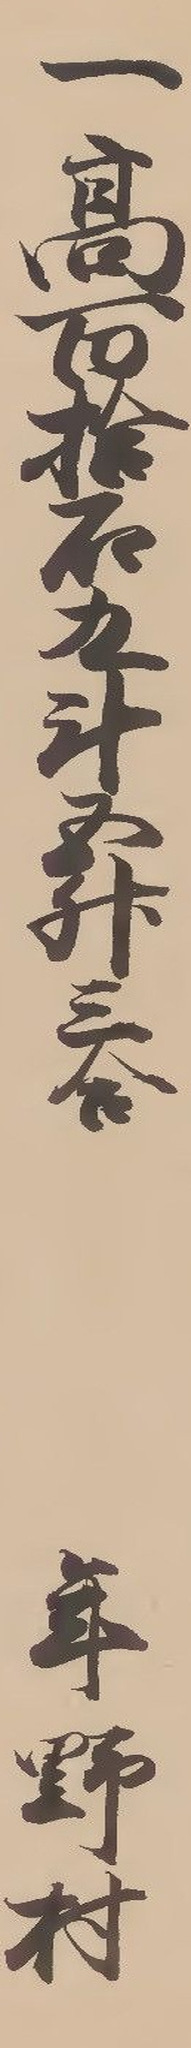一高百拾石九斗五升三合年野村
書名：豊後国郷帳
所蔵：国立公文書館 National Archives of Japan
